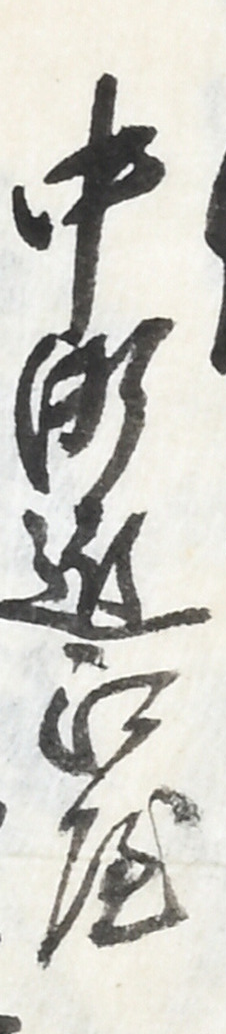中町近江屋
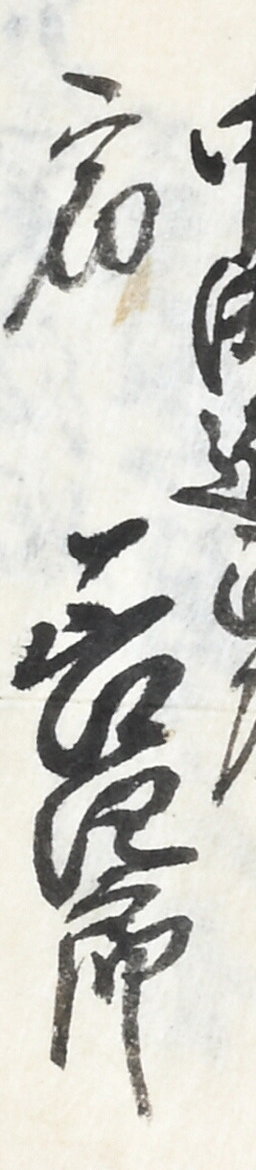宿善四郎
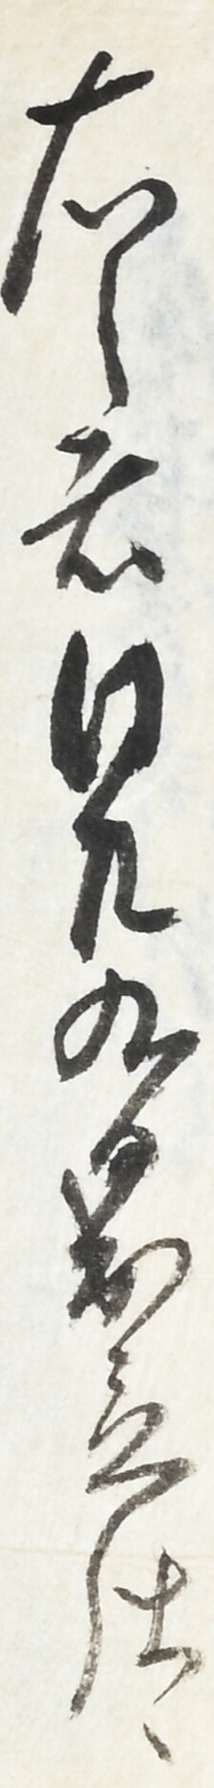右之者同廿六日出立仕候

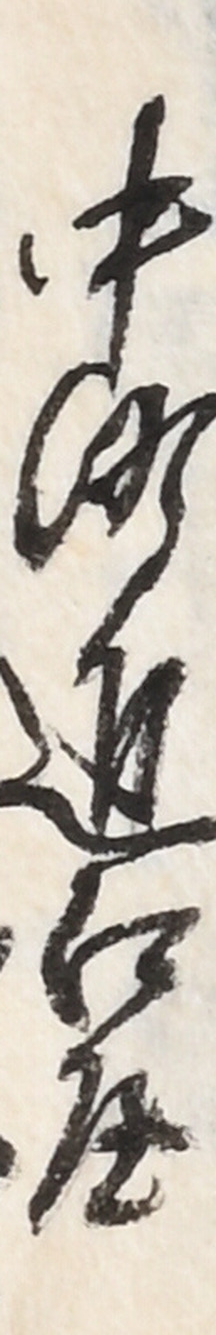中町近江屋
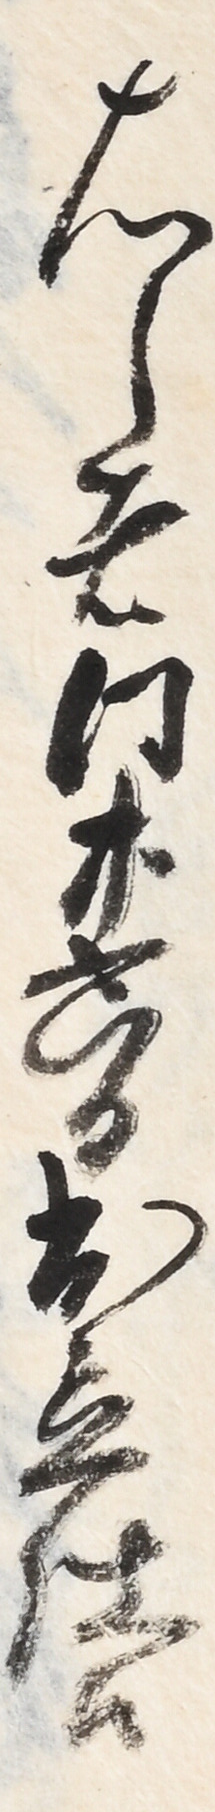右之者同廿九日出立仕候
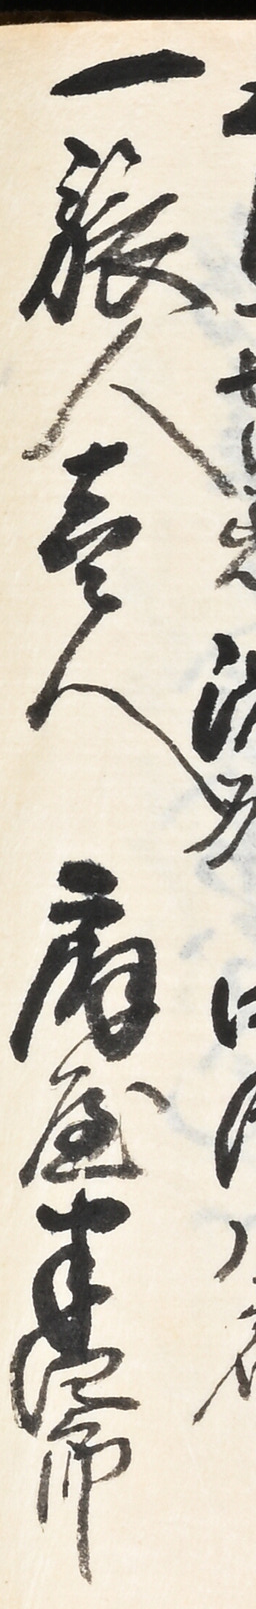一旅人壱人菱屋惣兵衛
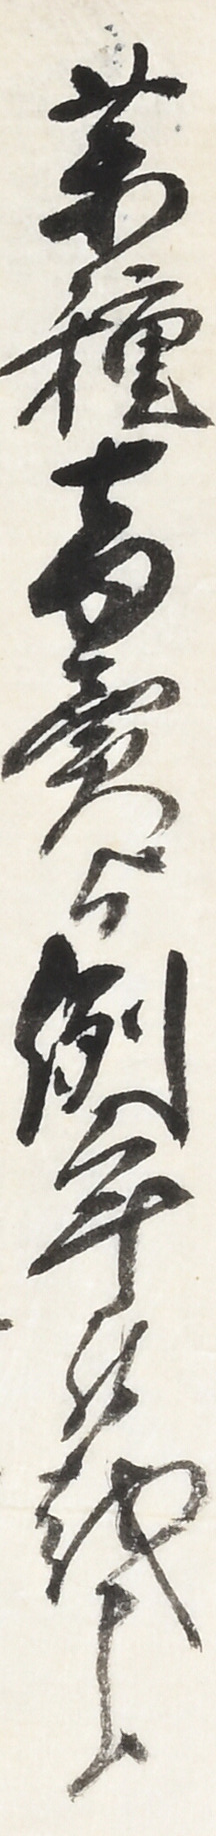薬種商売ニ而例年罷越申候
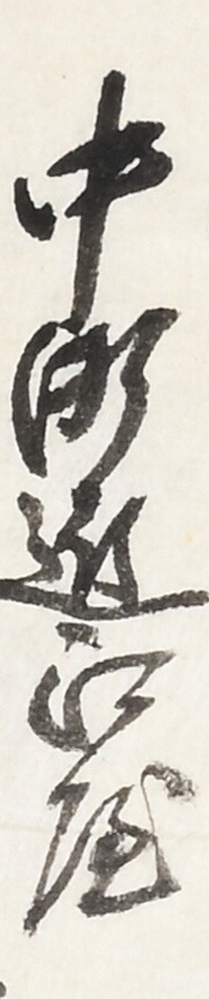中町近江屋
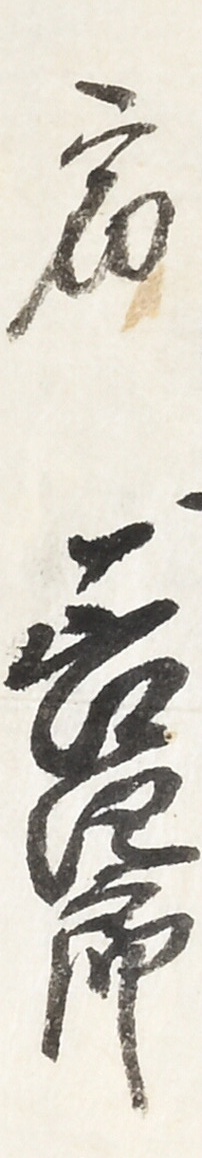宿善四郎
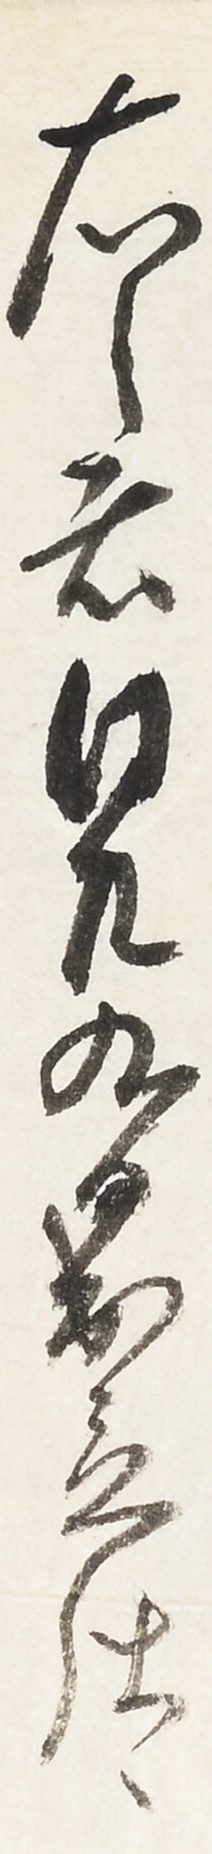右之者同廿九日出立仕候
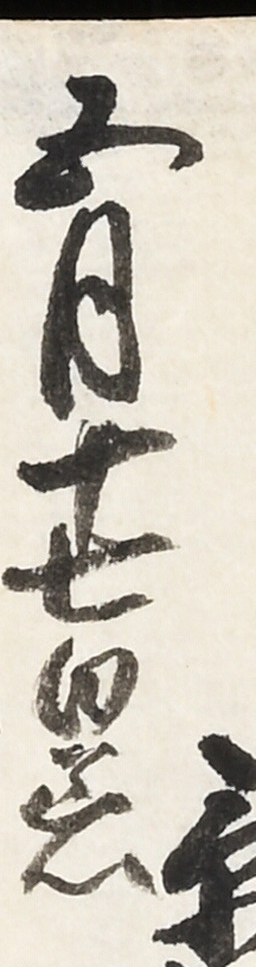五月十七日着
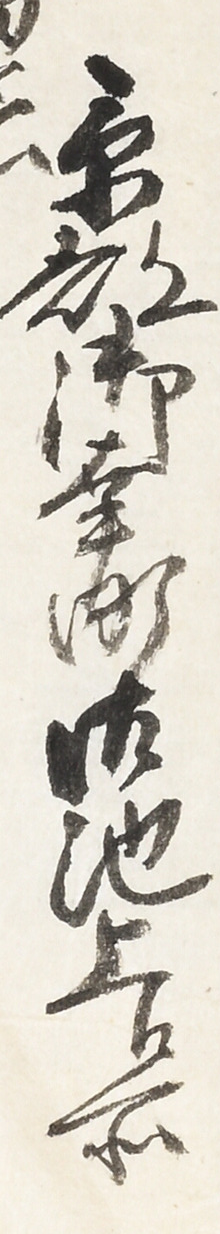京都御幸町御池上ル所
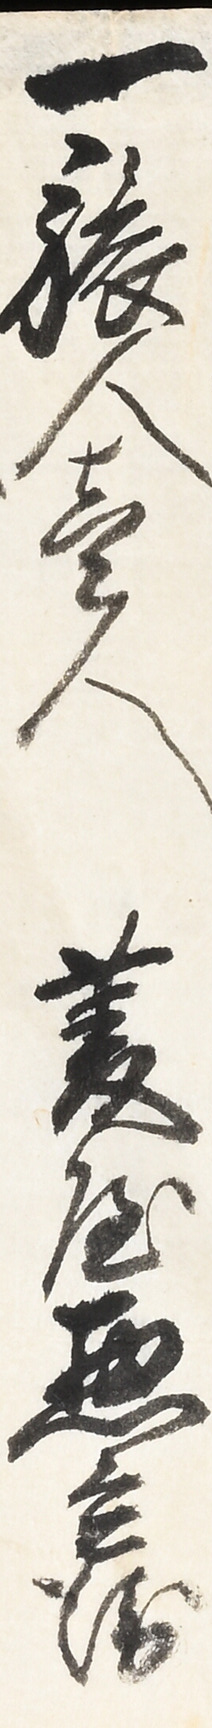一旅人壱人菱屋惣兵衛
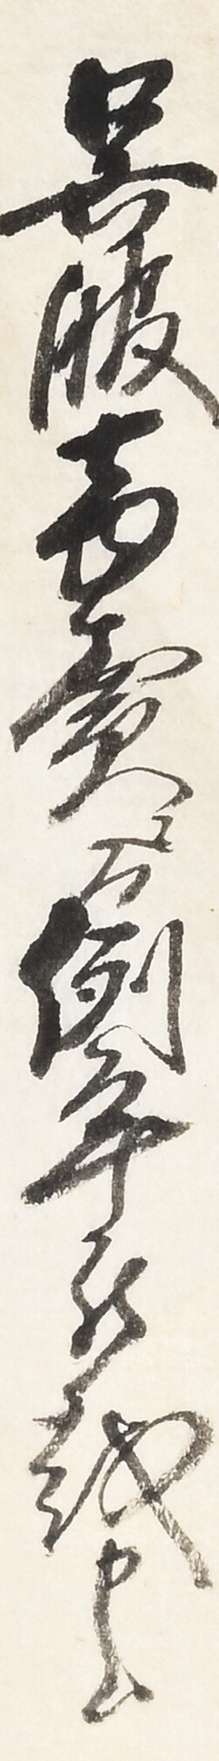呉服商売ニ而例年罷越申候
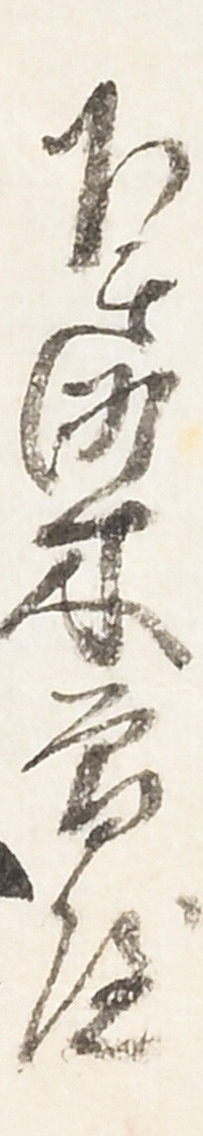下モ町木曽屋
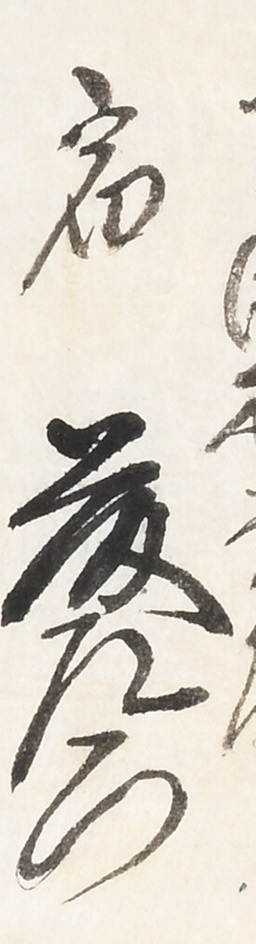宿籐左衛門
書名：旅人泊控帳
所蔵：伊那市立高遠町図書館・合同会社AMANE
